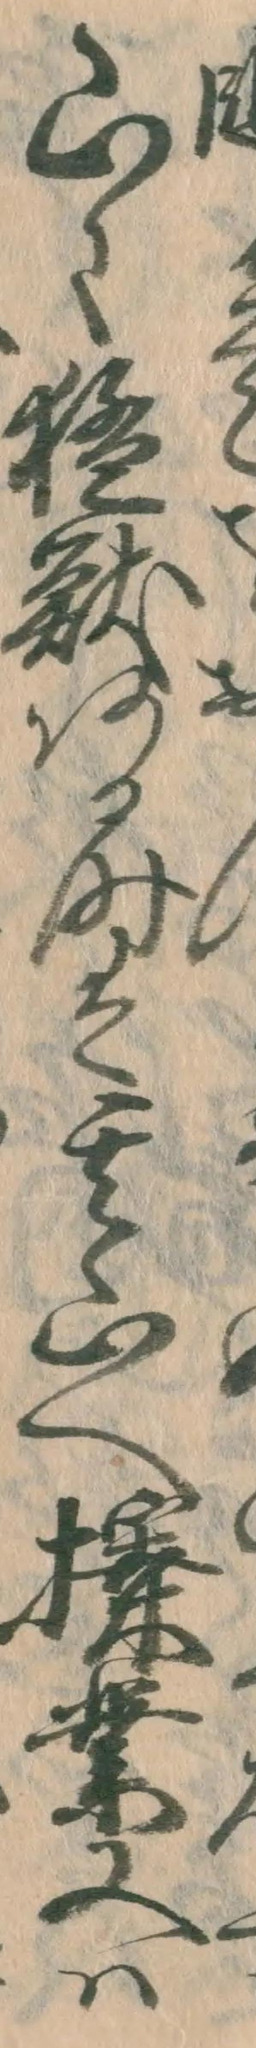山に猛獣ある時は其山へ業又ハ
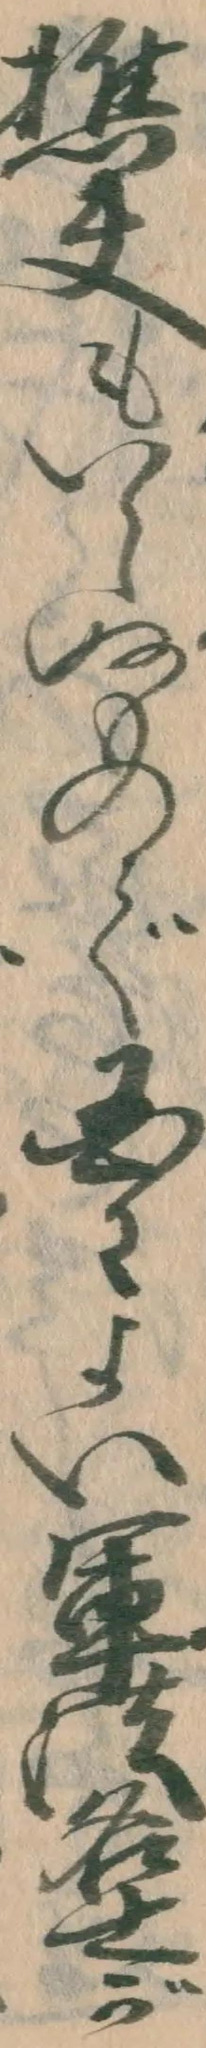樵夫もいらぬもので国によい軍法名士が
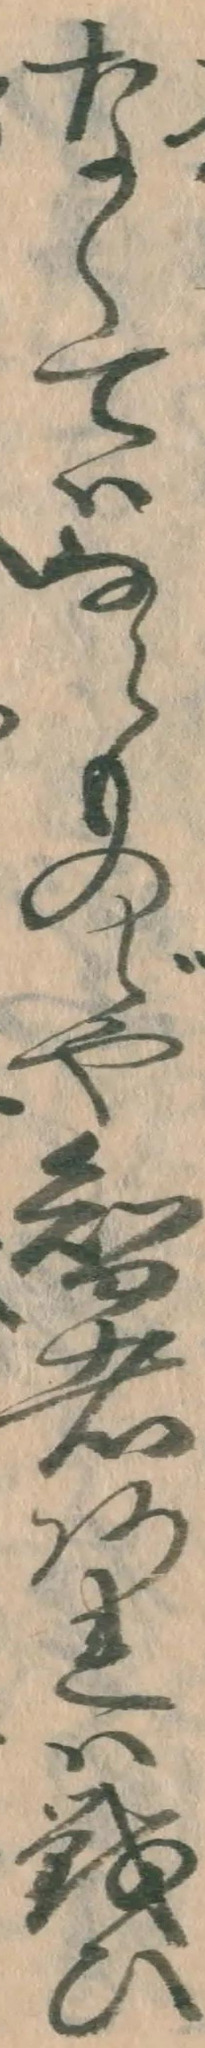なくてハならものじや智者あれハ戦ひ
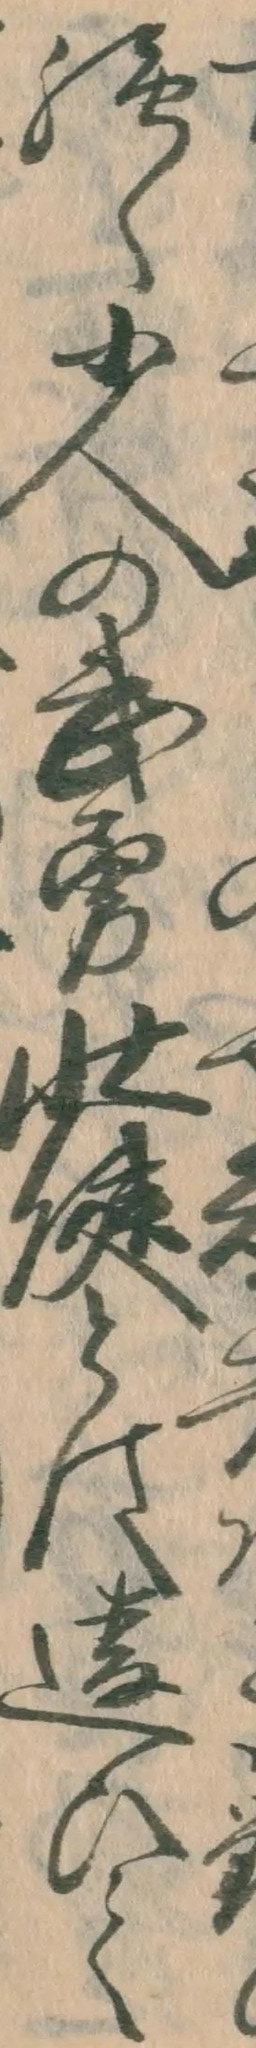強く小人の武勇壮健とは違ひて
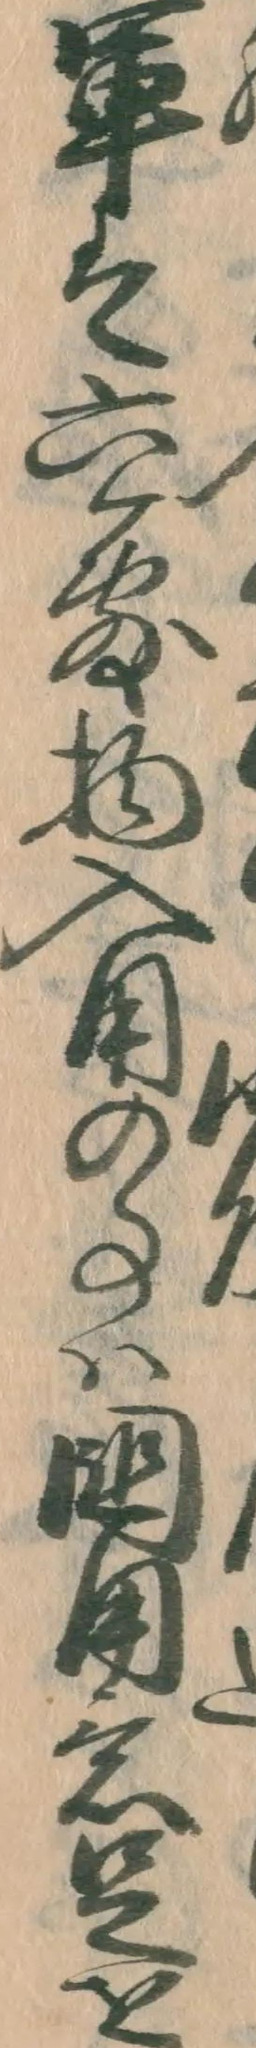軍は六ケ敷物入用の事ハ国用意足を
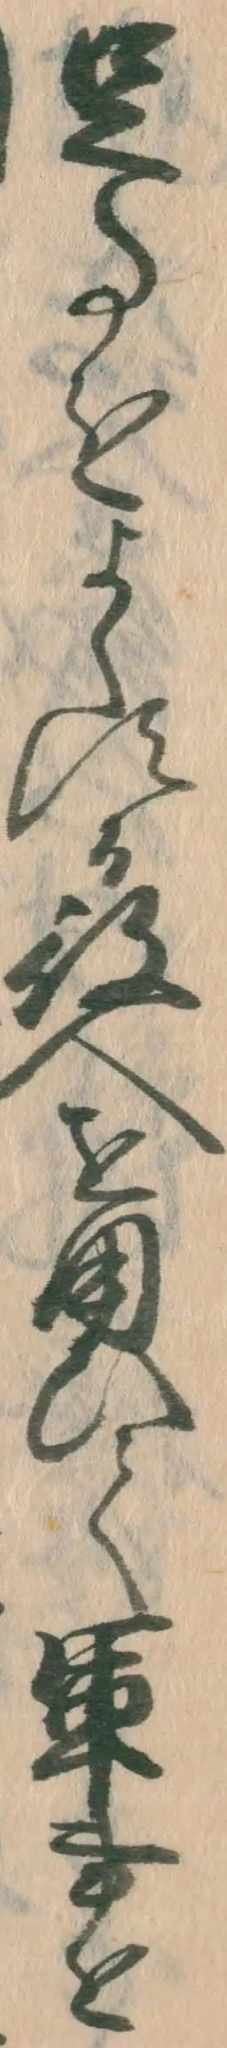足事をよくする役人を用ひて軍事を
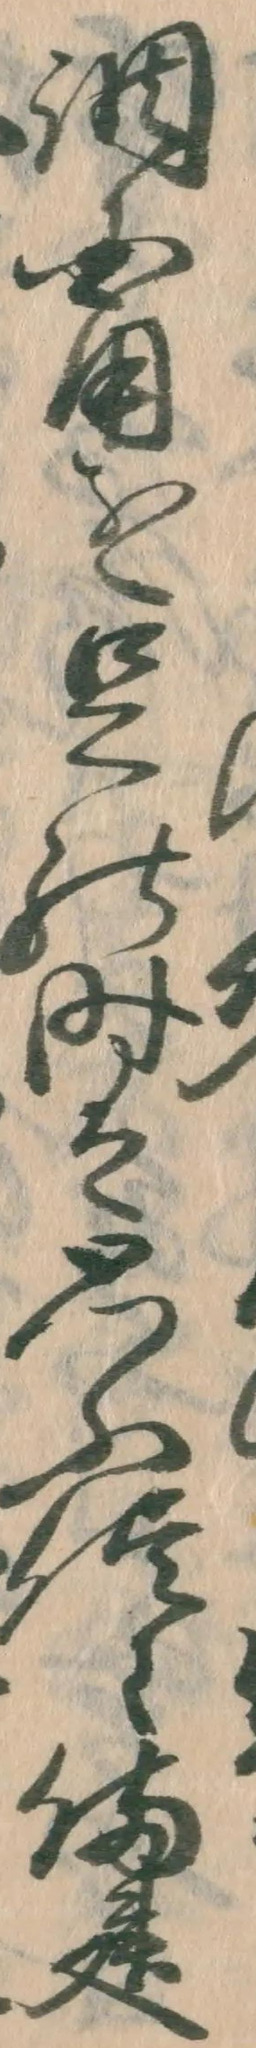調国用を足の時は思ふ儘に備建
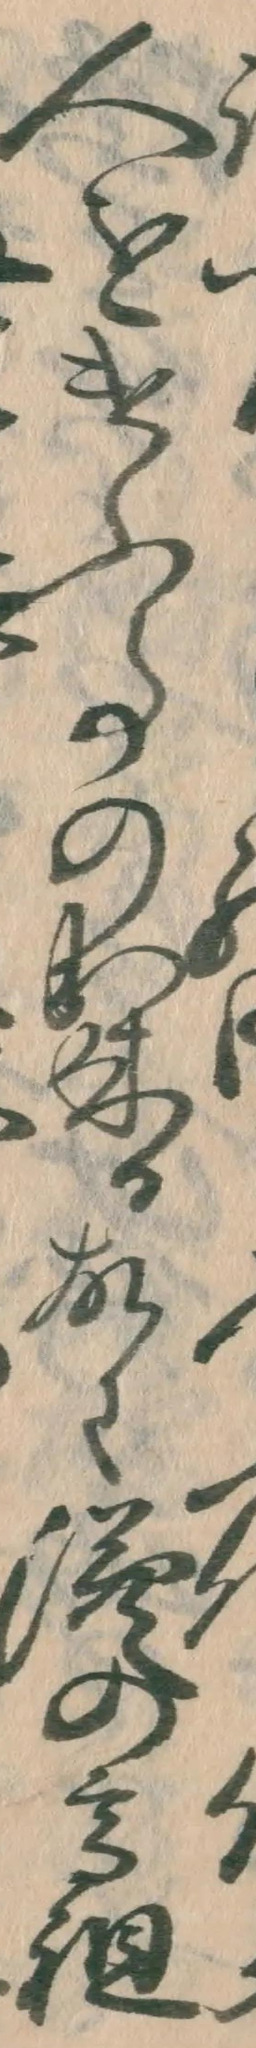人を遣ふ事の出来る故に漢の高祖
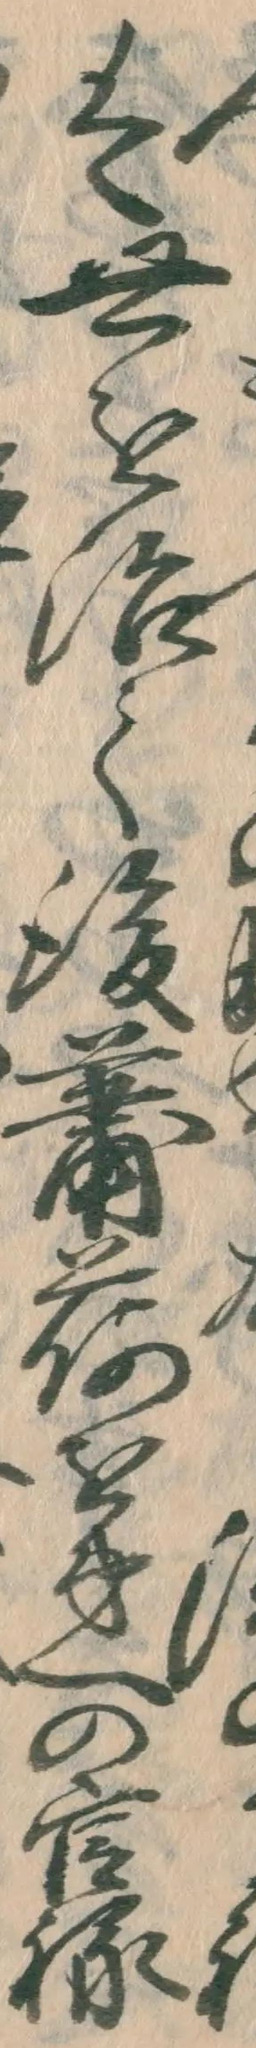は世を治て後蕭荷を第一の官禄
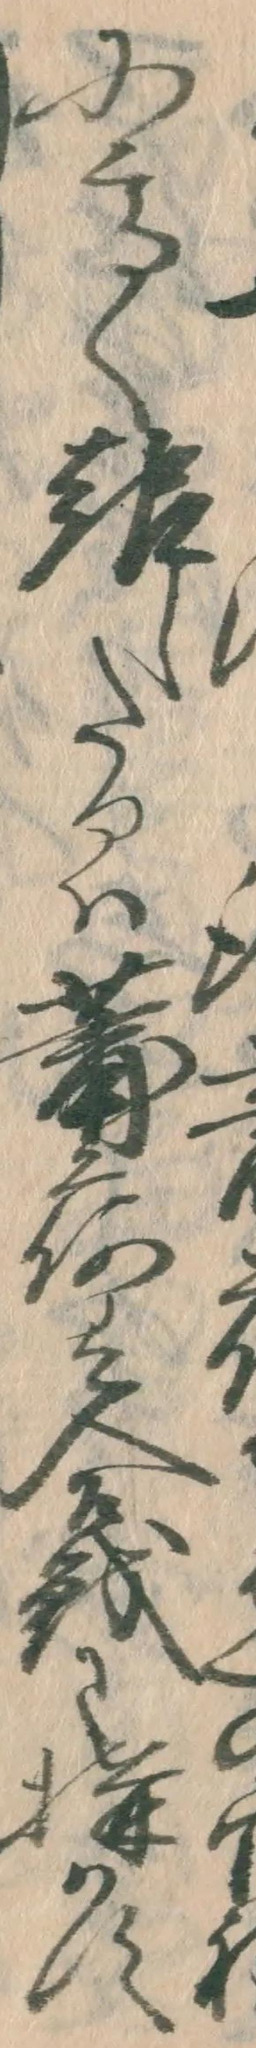に高く報したるハ蕭荷は合戦に構ハす
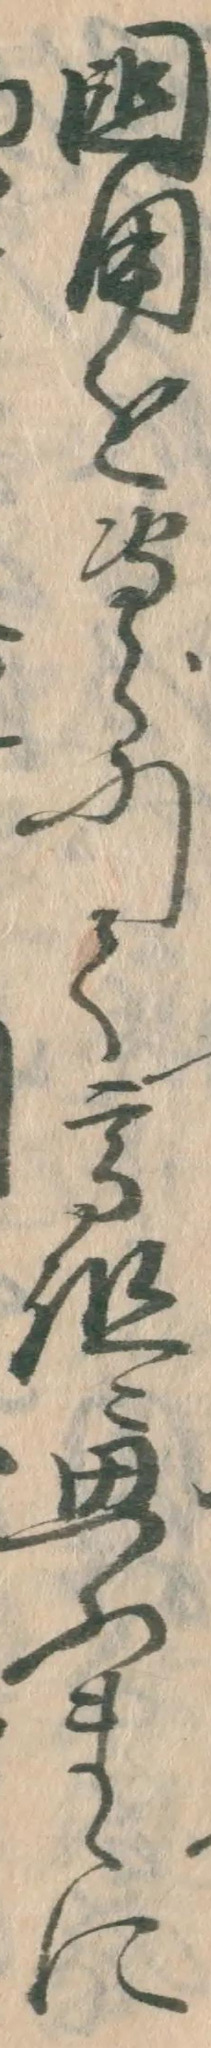国用を専らにして高祖ニ思ふまヽに
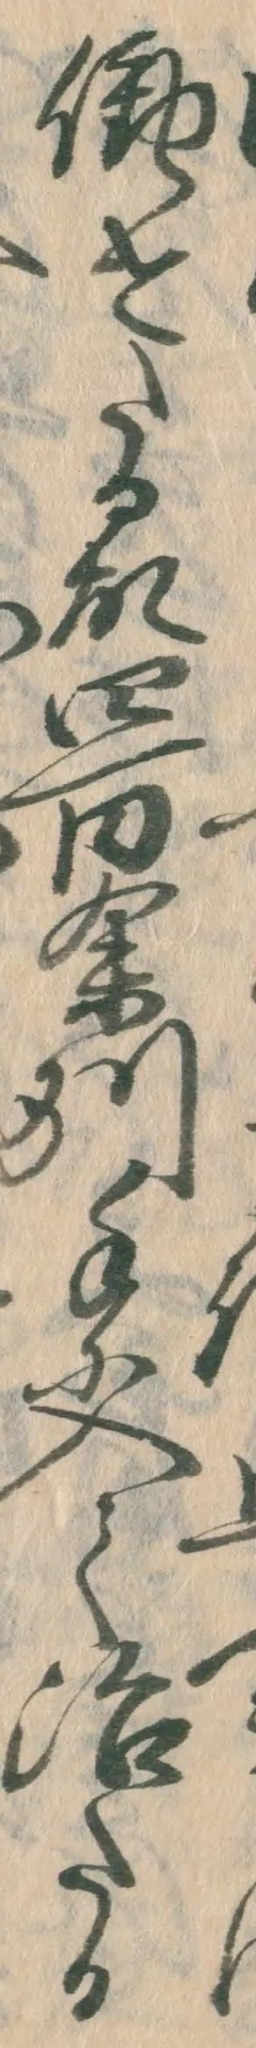働せたる故四百余州手に入て治たる
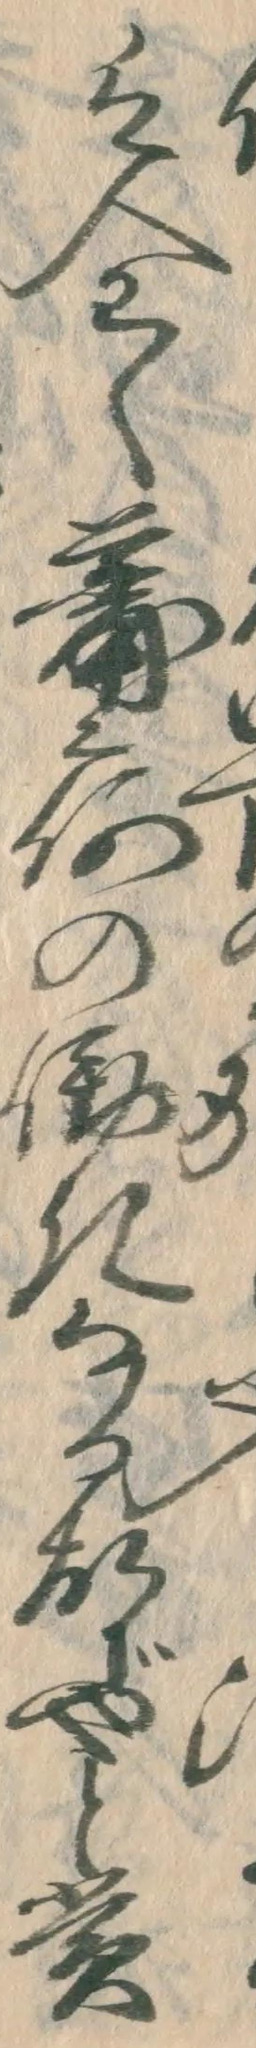は全く蕭荷の働なる故じやと賞
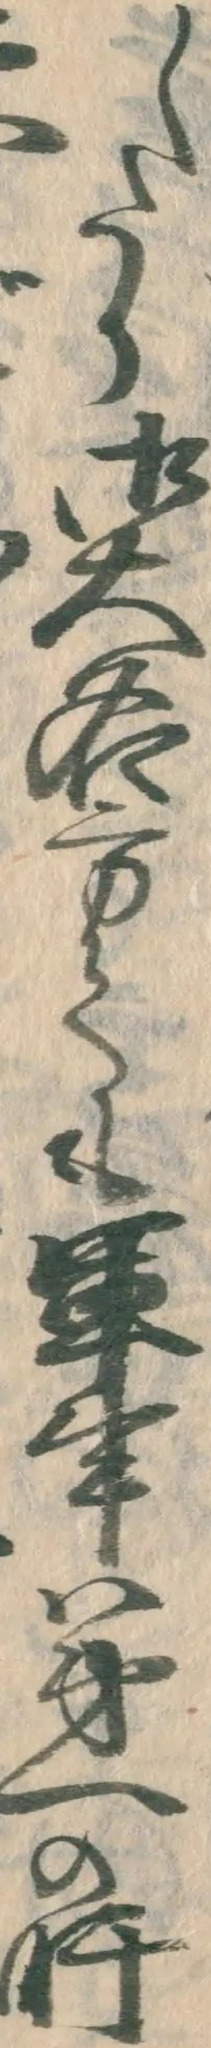したり御大名方ても軍事ハ第一の肝
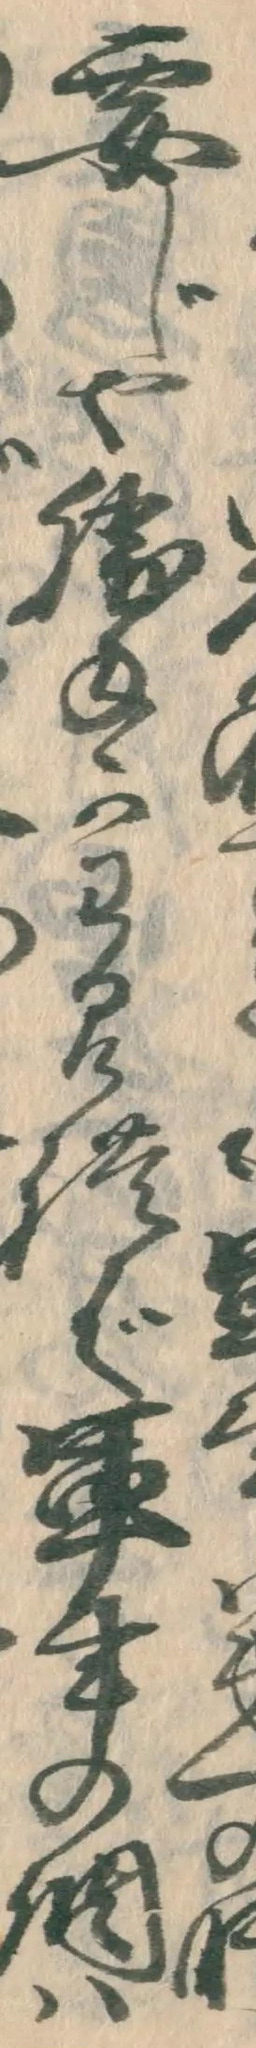要じや勝手かわるければ軍事の調ハ
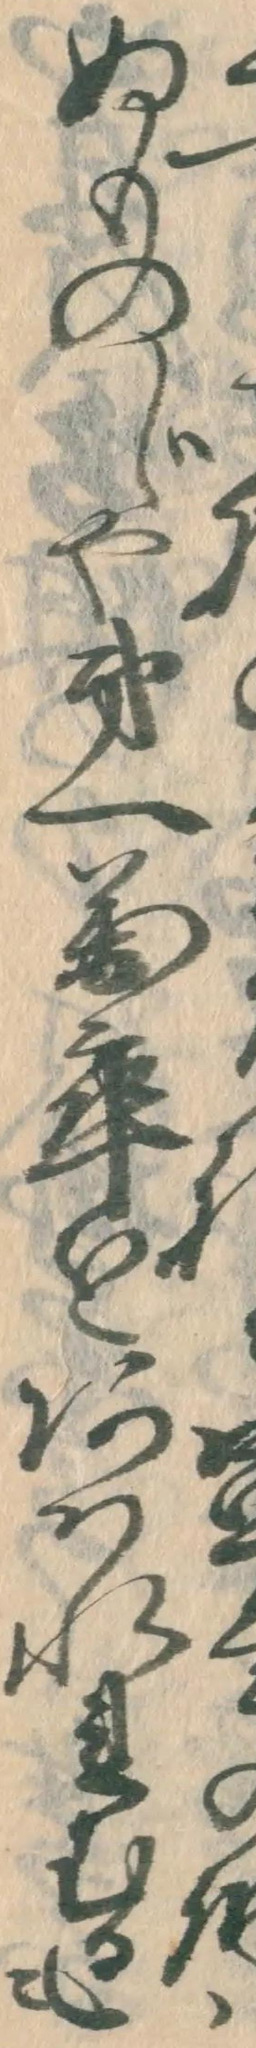ぬものじや第一萬卒をあかなれむるも
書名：麗斎叢書. 20
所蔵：国立国会図書館 National Diet Library, JAPAN
